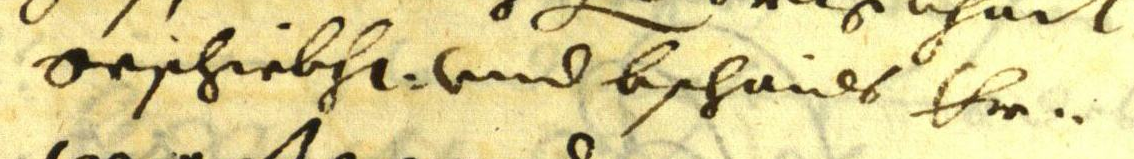geschickht: vnd bschaids Er¬
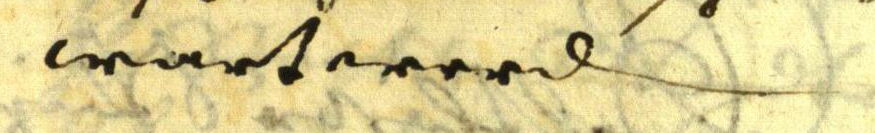wart werd
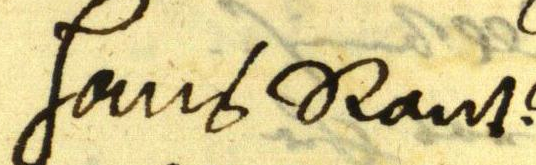Hans Rant¬
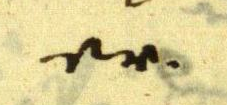er.
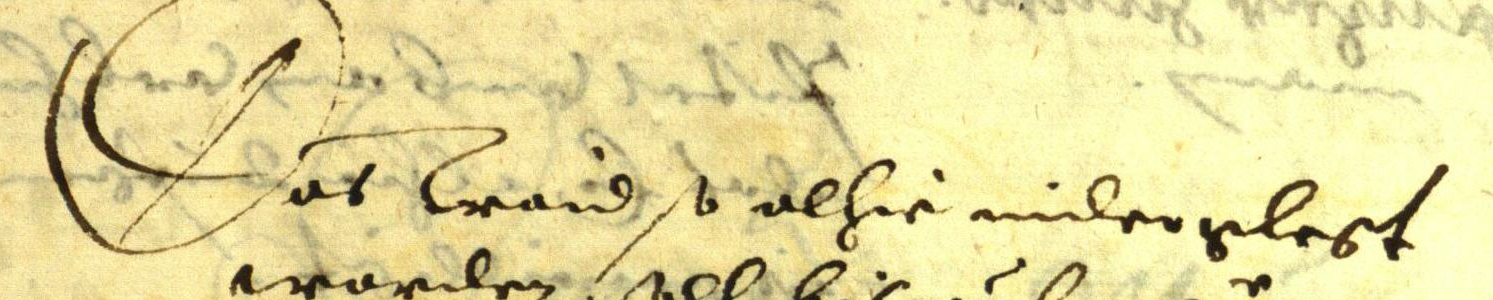Das Traid so alhie niderglegt
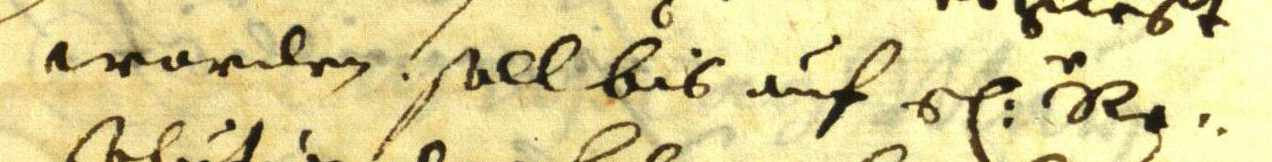worden. soll bis aūf g: Re¬
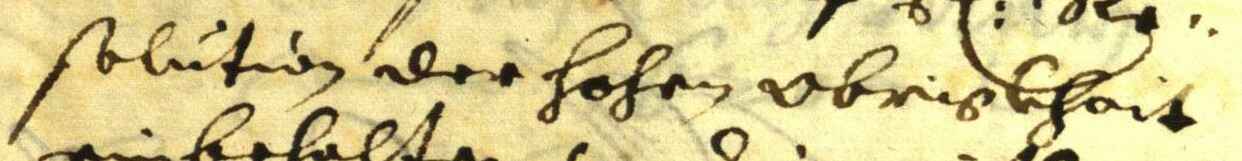solūtion der hohen Obrigkhait
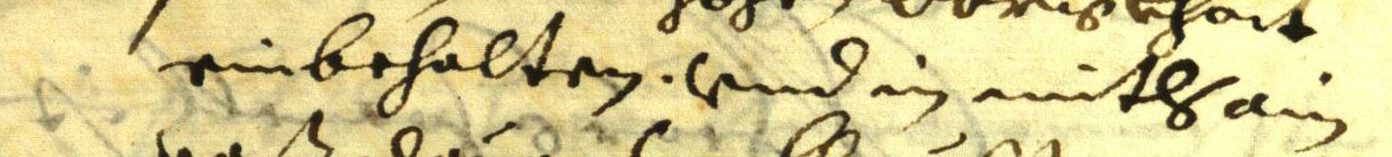einbehalten. vnd in mith ain
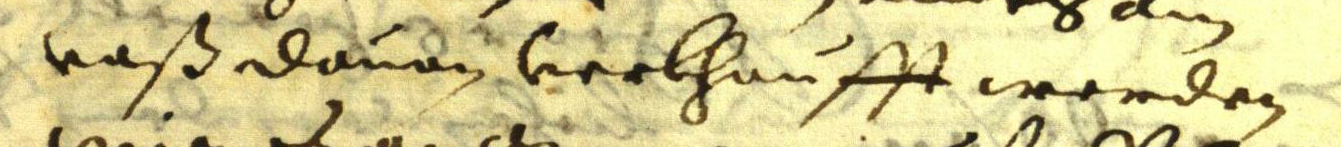vaß daūon verkhaūfft werden
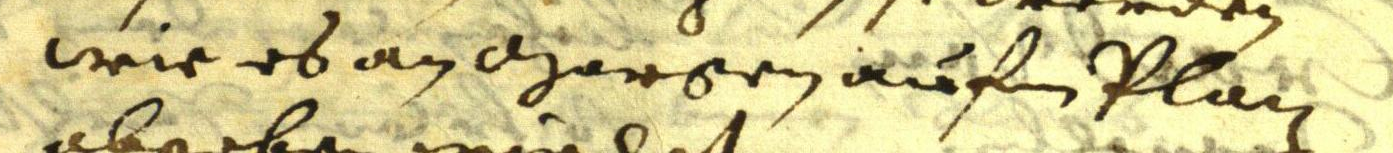wie es an Morgen aūfm Plaz
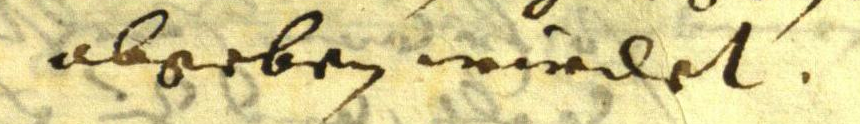abgeben wirdet.
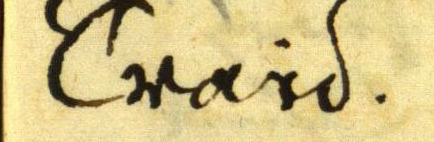Traid.
